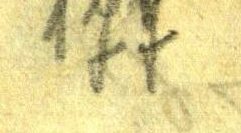177
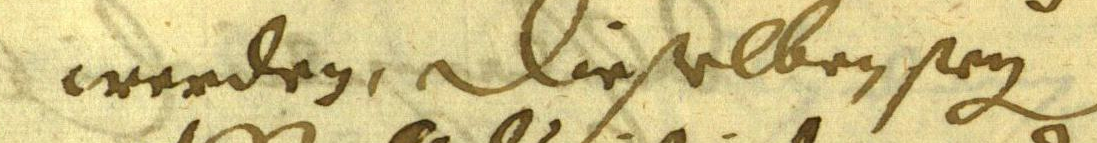werden, dieselben seȳ
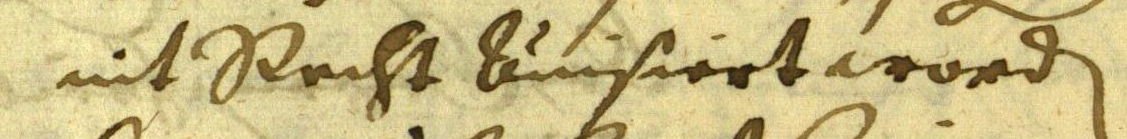nit Recht Aūisiert word.
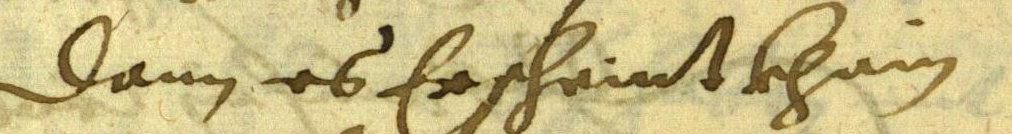dann es Erscheint khain
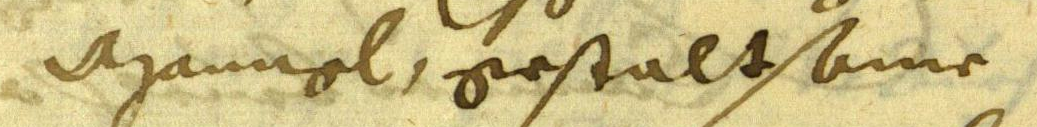Manngl, gestaltsame
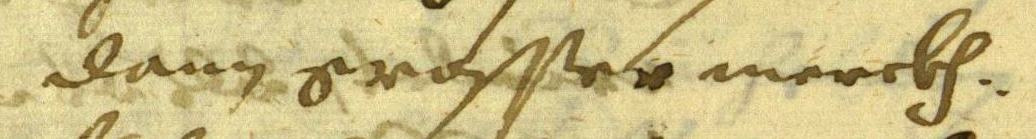dann grosser merckh¬
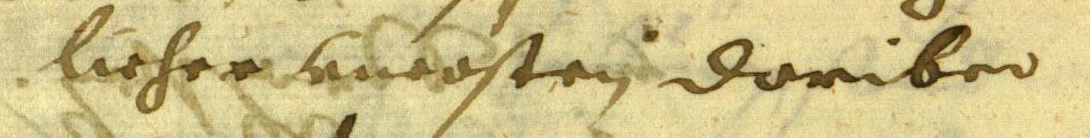licher vncosten dariber
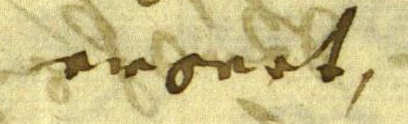ergeet,
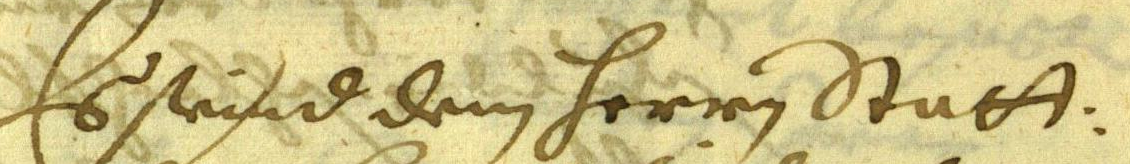Es seind dem herrn Statt¬
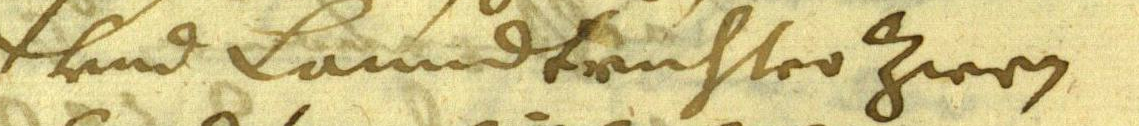vnd Lanndtrichter Zwen
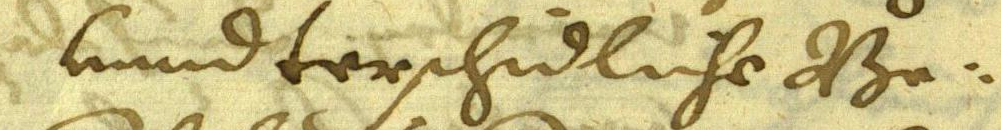vnndterschidliche Be¬
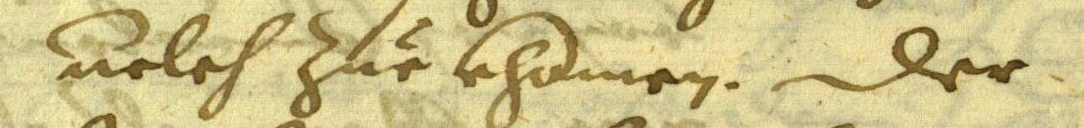ūelch Zūekhomen. der
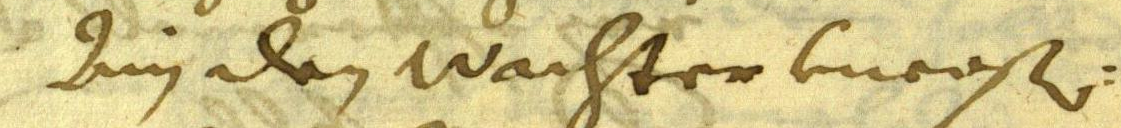Ain den Wachter vncost¬
